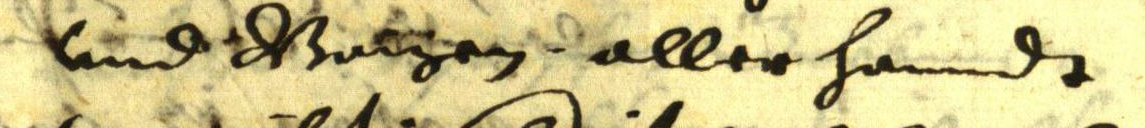vnd Bozen aller hanndt
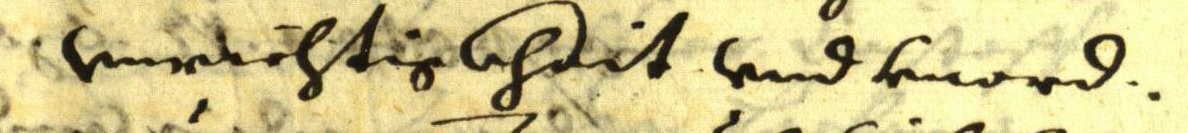vnrichtigkhait vnd vnord¬
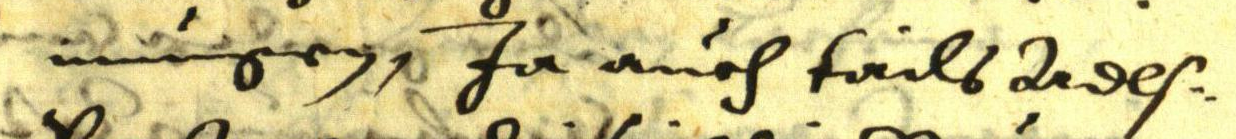nūngen, Ja aūch tails Adls¬
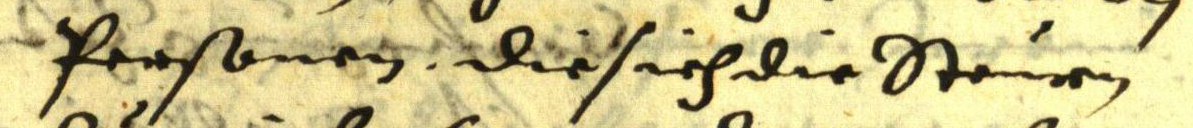Personen. die sich die Steūrn
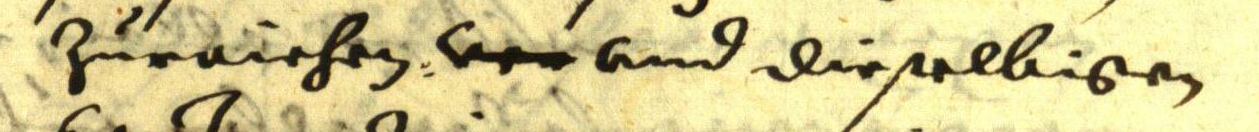Zūraichen ver vnd die selbigen
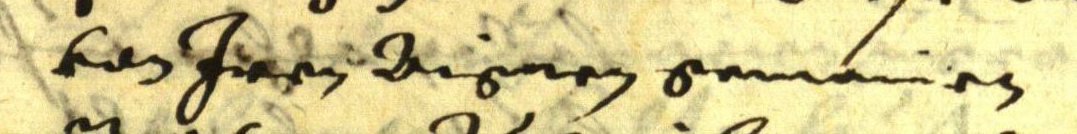von Iren Aignen gemainen
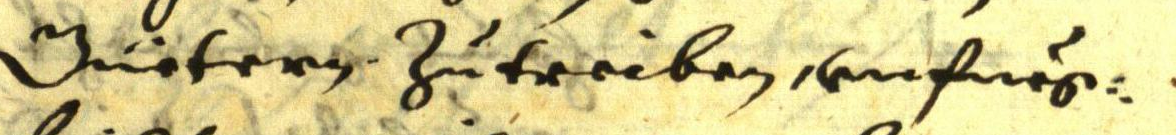Gūetern Zūtreiben, vnfūeg¬
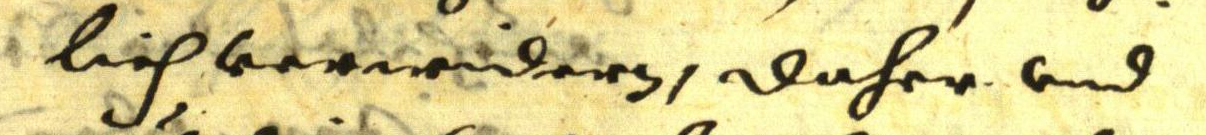lich verwidern, daher vnd
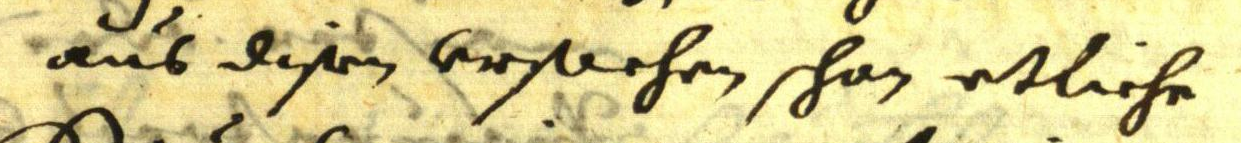aūs disen vrsachen schon etliche
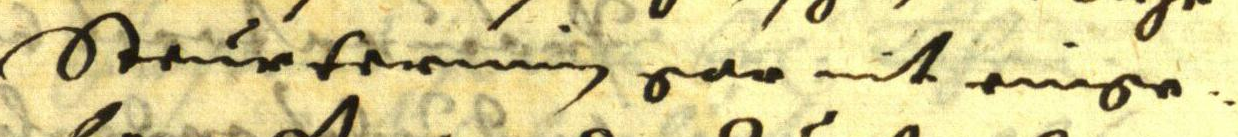Steūrtermin gar nit einge¬
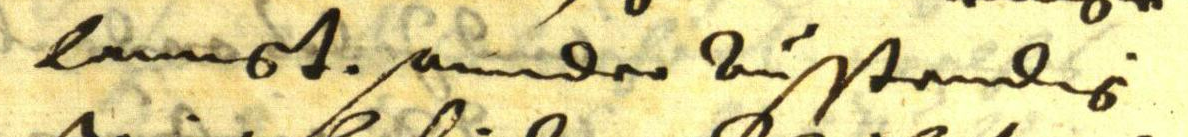lanngt. sonnder Aūsstendig
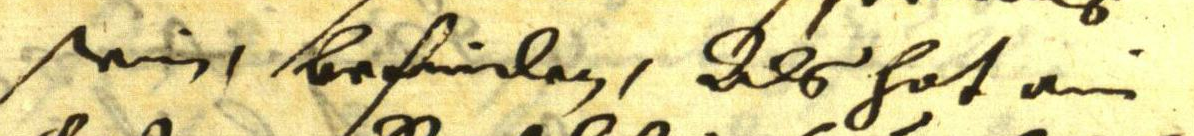sein, befinden, Als hat ain
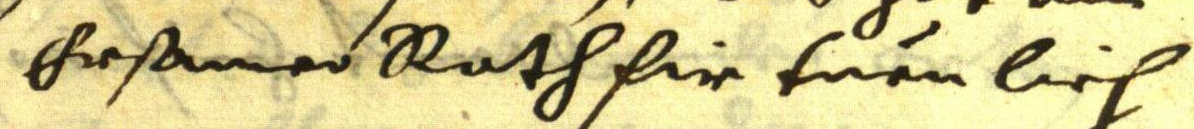Ersamer Rath fir tūen lich
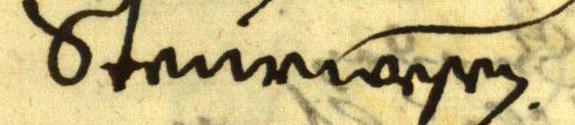Steūrwesen.
